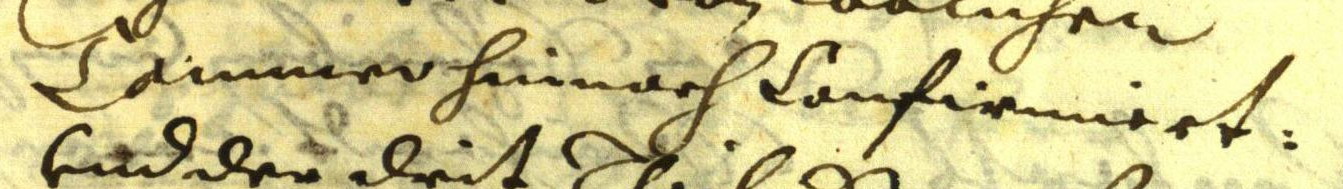Cammer hinnach Confirmiert:
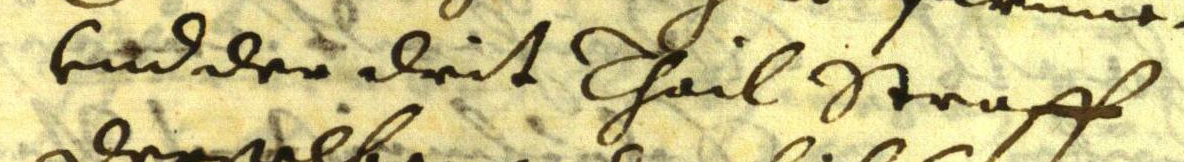vnd der drit Thail Straff
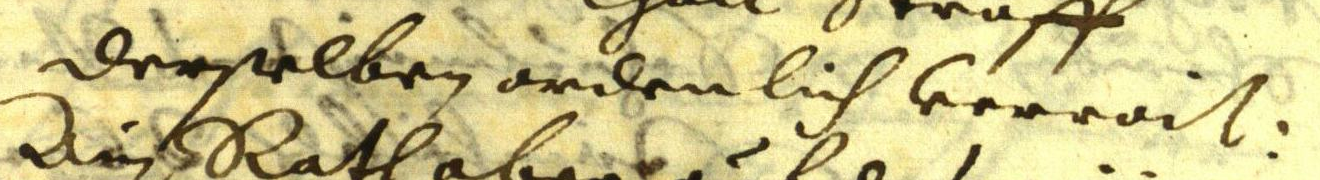derselben ordenlich verrait.
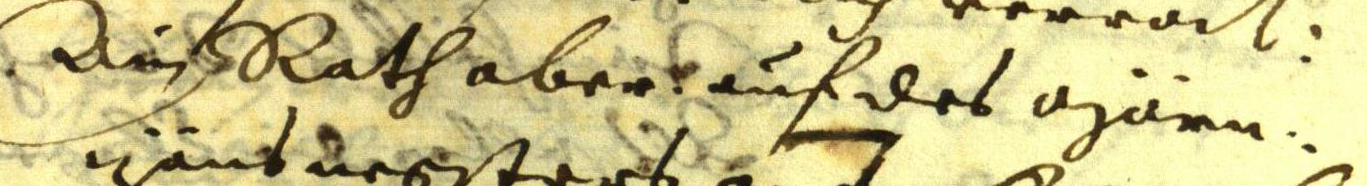Ain Rath aber aūf des Märn¬
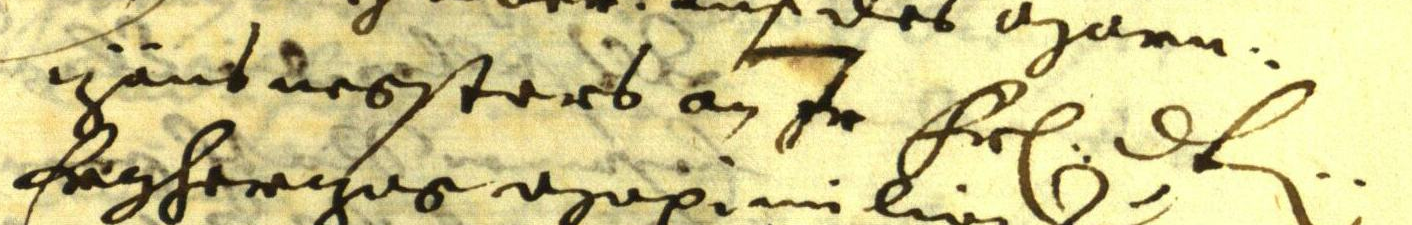zäns negsters an Ir Frl: Dl:
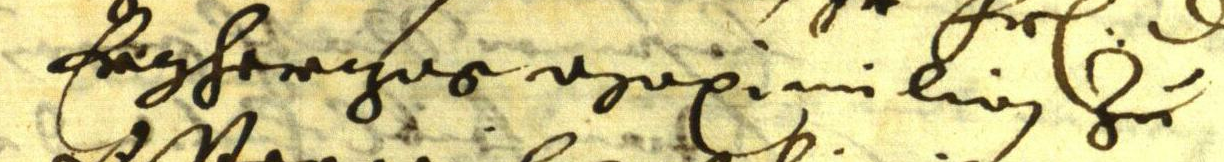Erzherzog Maximilian Zū
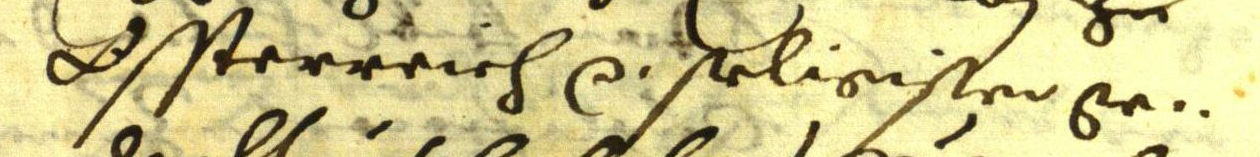Ossterreich etc. seligister ge¬
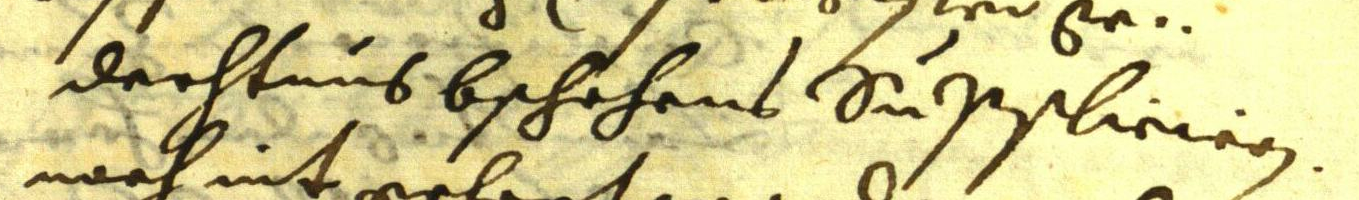dachtnūs beschehens Sūpplicieren.
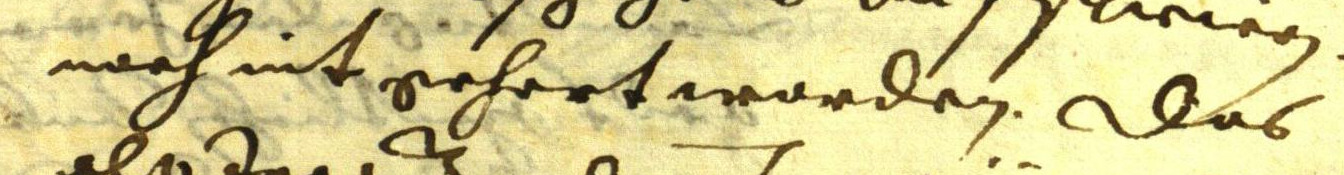noch nit gehert worden. Das
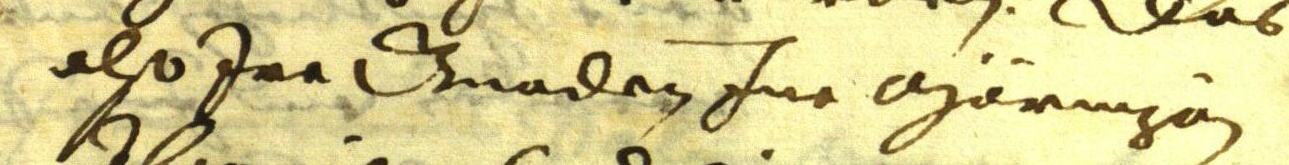also Ire Gnaden Ine Märnzän
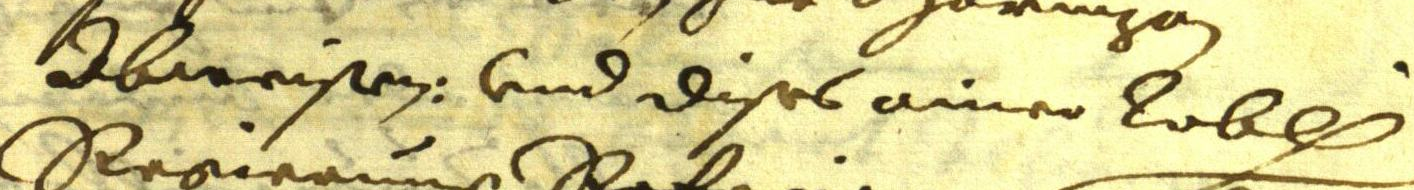Abweisen: vnd dises ainer Lobl
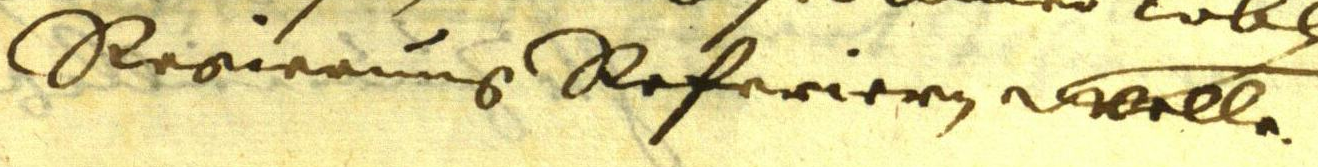Regierūng Referieren welle.
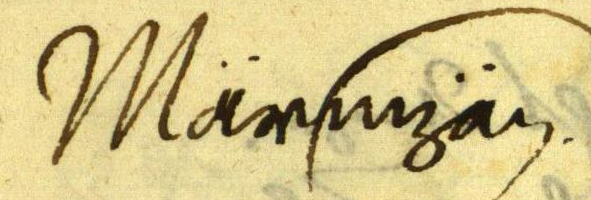Märnzän.
